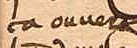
ca ouuera
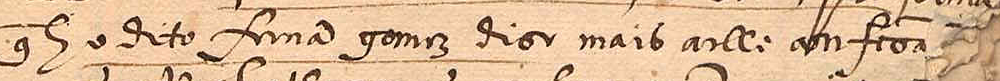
q̄ ho dito fernā gomez dise mais a elle confesā
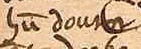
hū doutor
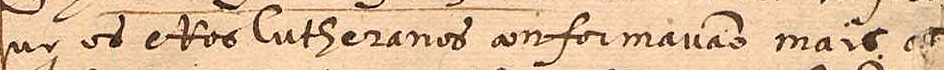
que os eRos lutheranos conformauão mais os
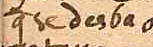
q̄ se desba
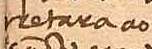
rretara ao
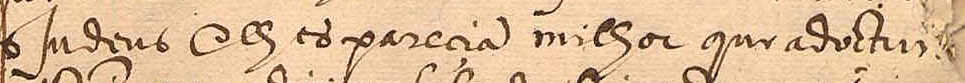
os Judeus e lhes pareciā milhor que a doctri
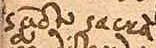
sācto sacra
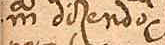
mto dizendo
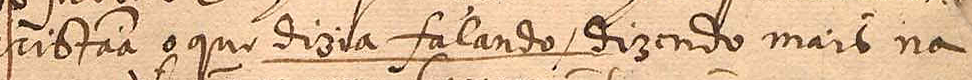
cristaā o que dizia falando / dizendo mais na
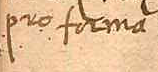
pro forma
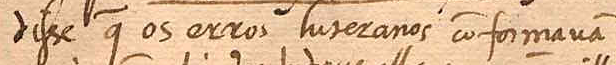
disse q̄ os erros luteranos c̄oformauā
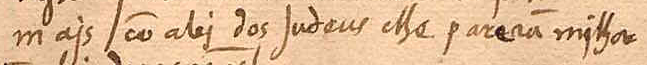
majs cō a lej dos Judeus e lhe parciā mjlhor
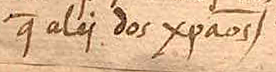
q̄ a lej dos xpãos /
